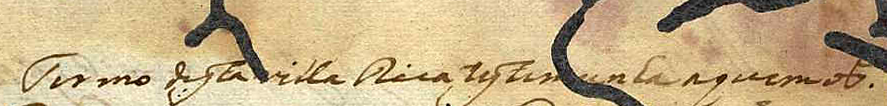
Termo desta villa Rica testemunha a quem o s.r
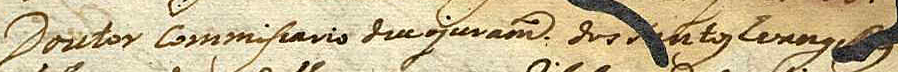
Doutor commissario deu o juram.to dos santos Evangelhos
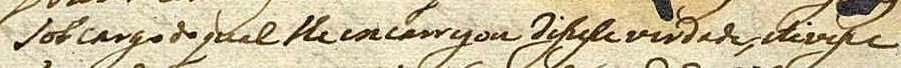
sob cargo do qual lhe encarregou dissesse verdade, e tivesse
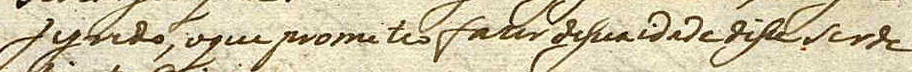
segredo, o que prometeo fazer de sua idade disse ser de
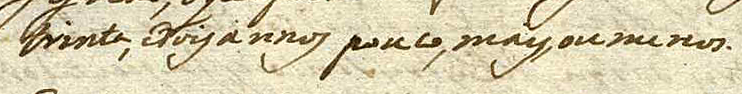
trinta, e dois annos pouco mais, ou menos.
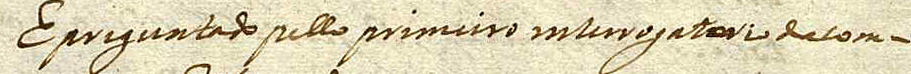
E preguntado pello primeiro interrogatorio da com
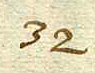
32
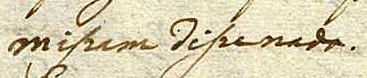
missam disse nada.
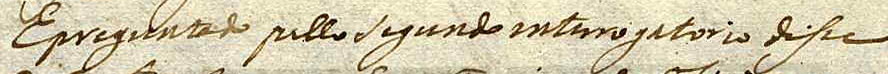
E preguntado pello segundo interrogatorio disse
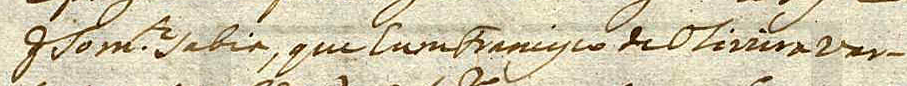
q̄ som.te sabia, que hum Francisco de Oliveira Var
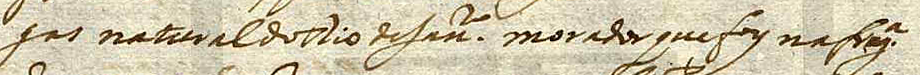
gas natural do Rio de Jan.ro morador que foy na freg.a
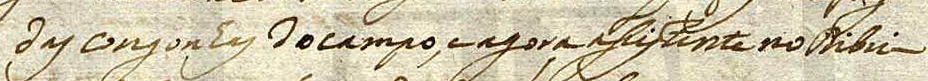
das congonhas do campo, e agora assistente no Ribei
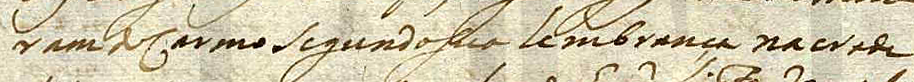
ram do Carmo segundo sua lembrança na era de
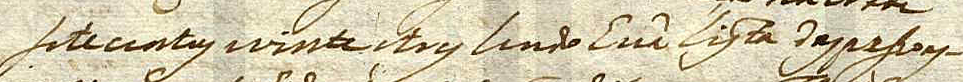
setecentos e vinte e tres lendo huā lista das pessoas
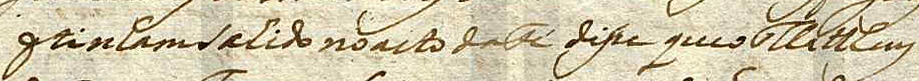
q̄ tinham sahido no acto da Fé disse que o Mattheus
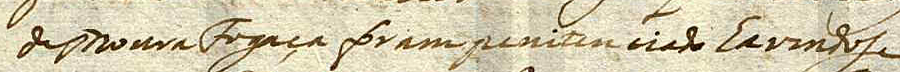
de Moura Fogaça foram penitenciado havendose
